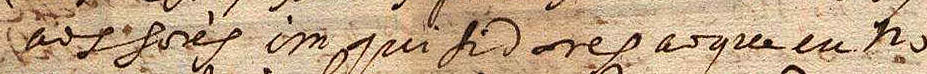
aos sorēs imquisidores ao que eu no
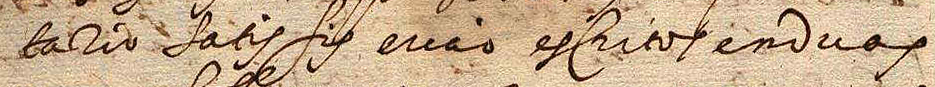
tario satisfis e uaõ esCritos en duas
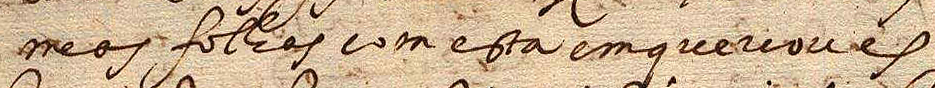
meas folhas com esta em que uou es
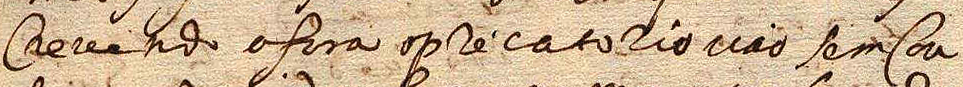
Creuendo a fora o precatorio uaõ sem Cou
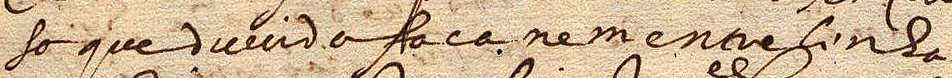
sa que duuida faça nem entrelinha
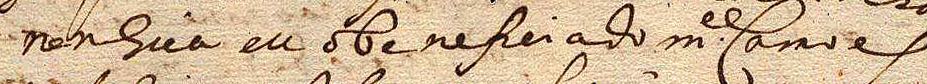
nenhuā eu o beneficiado mel Camoes
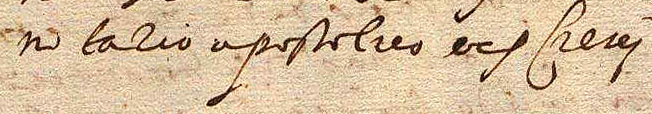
notario apostolico o esCreuj
